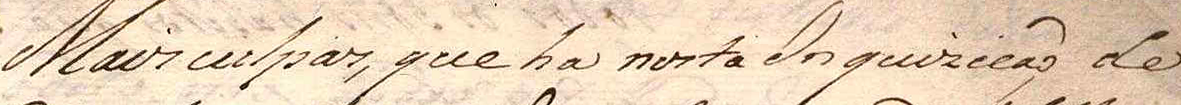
Mais culpas, que ha nesta Inquiziçaõ de
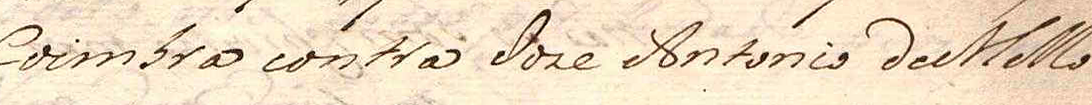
Coimbra contra Ioze Antonio de Mello
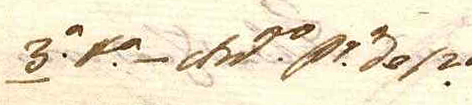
3.a t.a - Anto. Pr. de sza
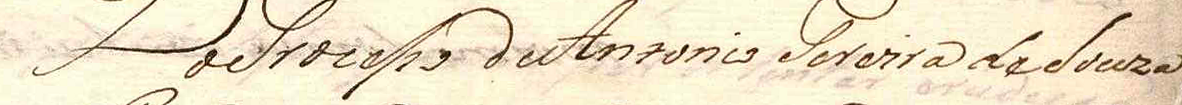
Do Prozesso de Antonio Pereira de Souza
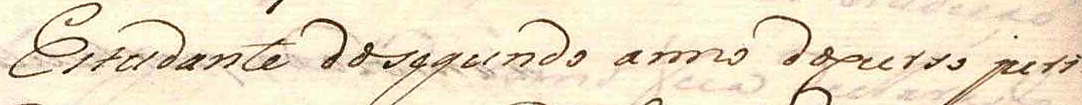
Estudante do segundo anno do Curso juri
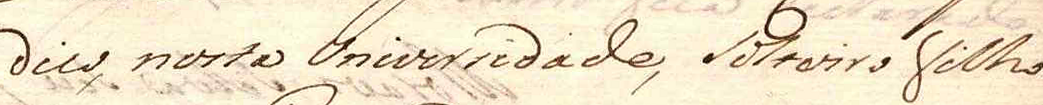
dico, nesta Universidade, solteiro filho
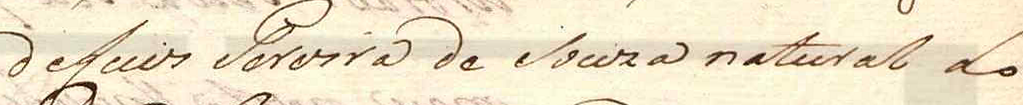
de Luis Pereria de souza natural do
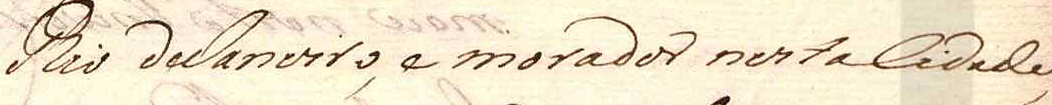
Rio de Ianeiro, e morador nesta Cidade,
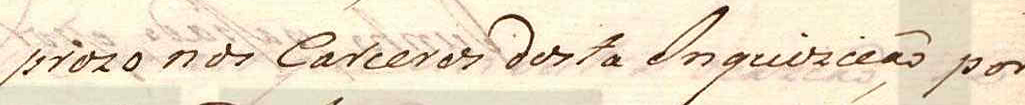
prezo nos Carceres desta Inquizição por
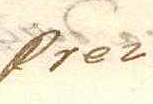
Prez.
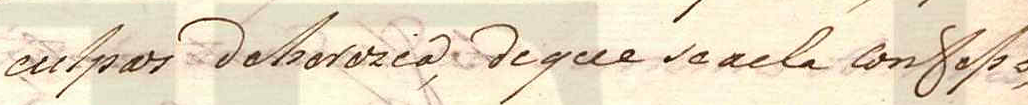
culpas de herezia, de que se acha confesso,
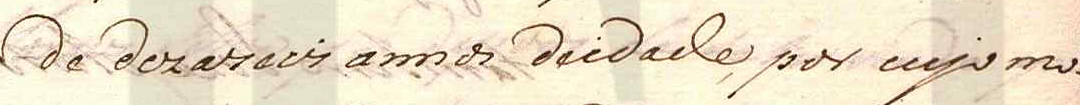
de dezaseis annos de idade, por cujo mo
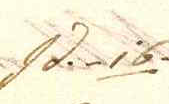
Jd. - i6-
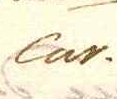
Car.
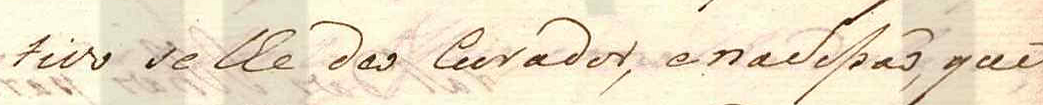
tivo se lhe deo Curador, e na sessaõ, que
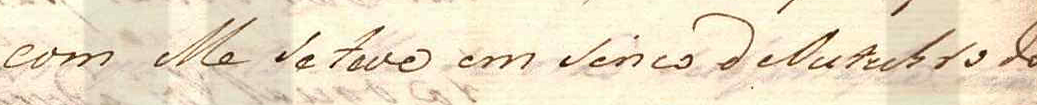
com elle se teve em sinco de Outubro do
